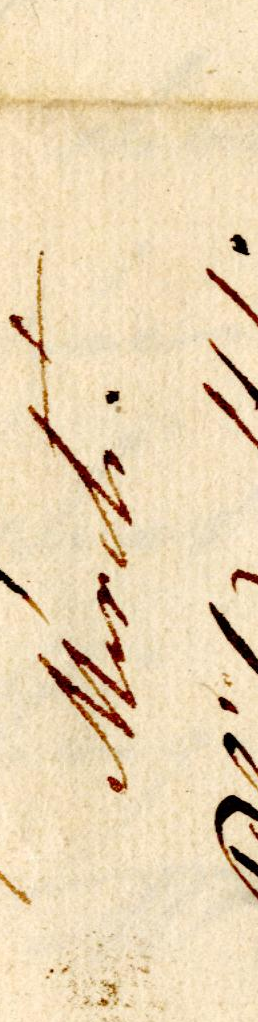Merch^t
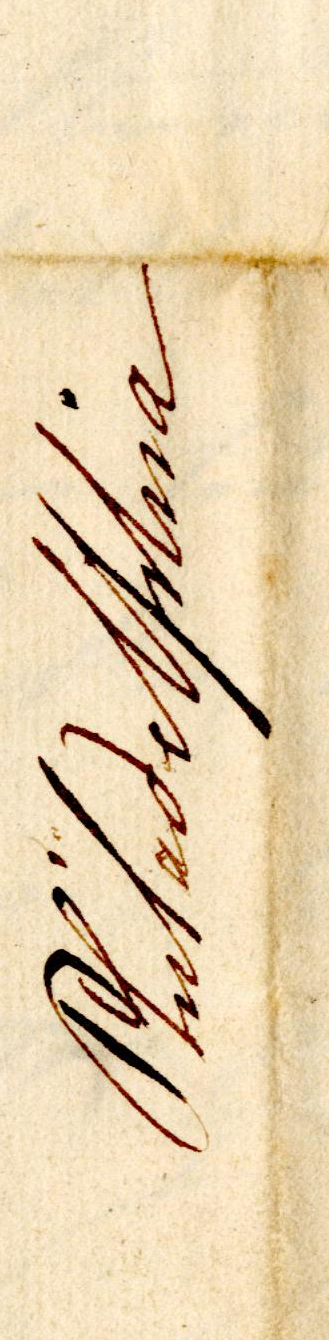Philadelphia
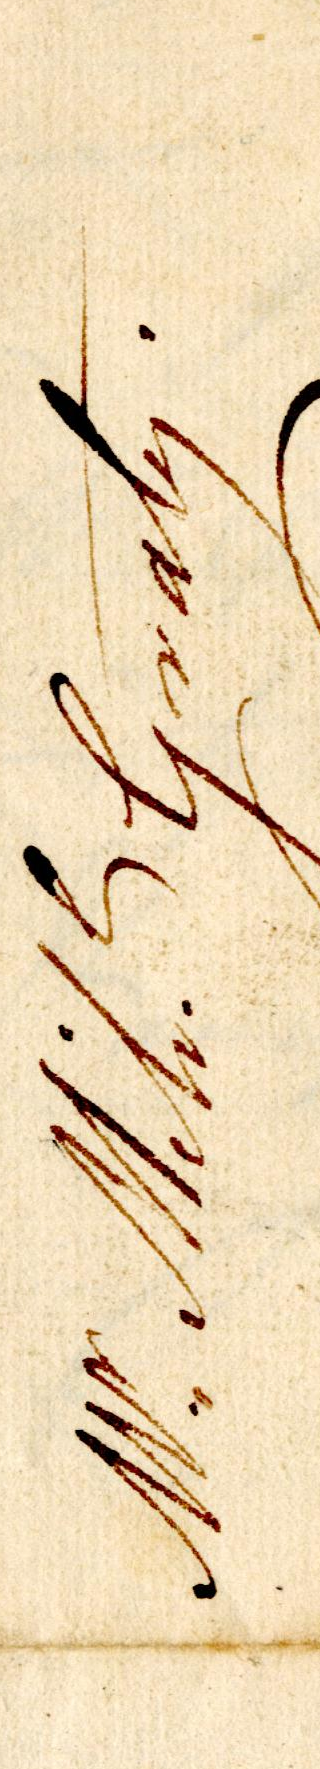M^r Mich^l Gratz
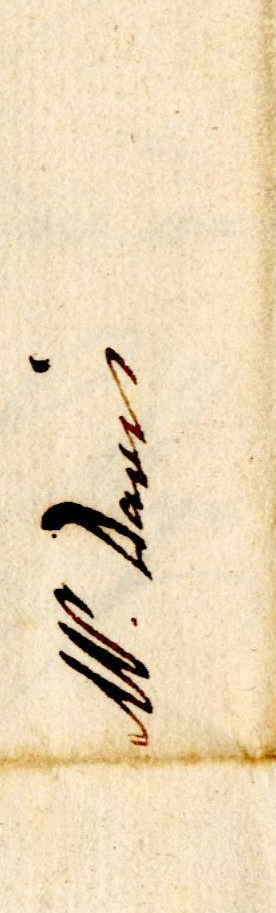M^r Davis
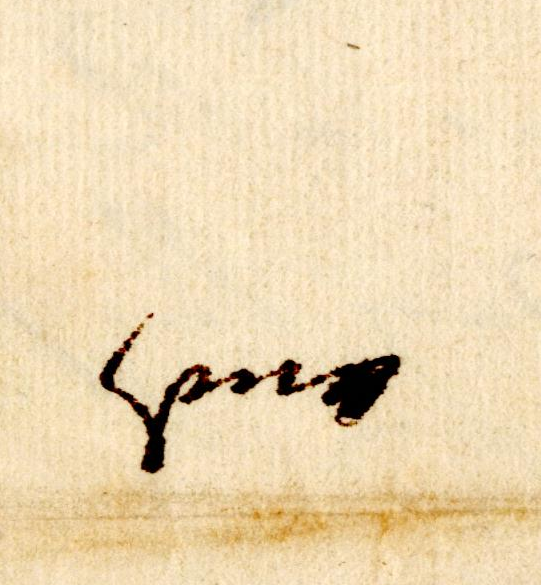red
